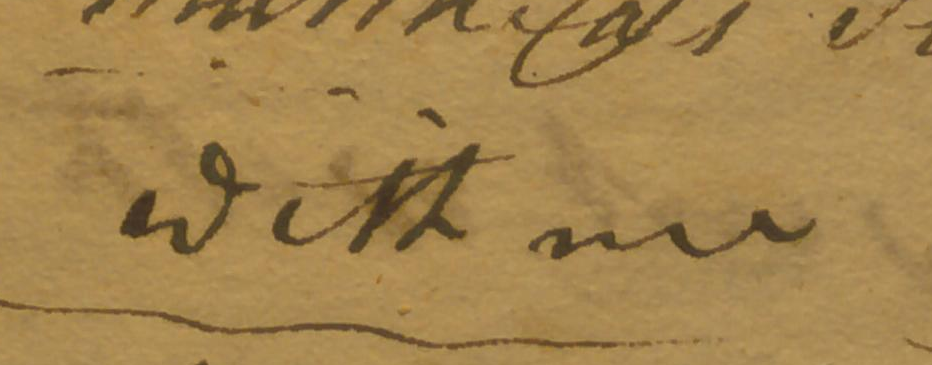with me
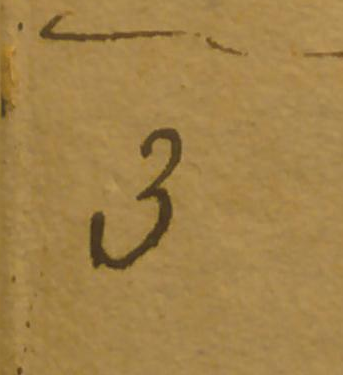3
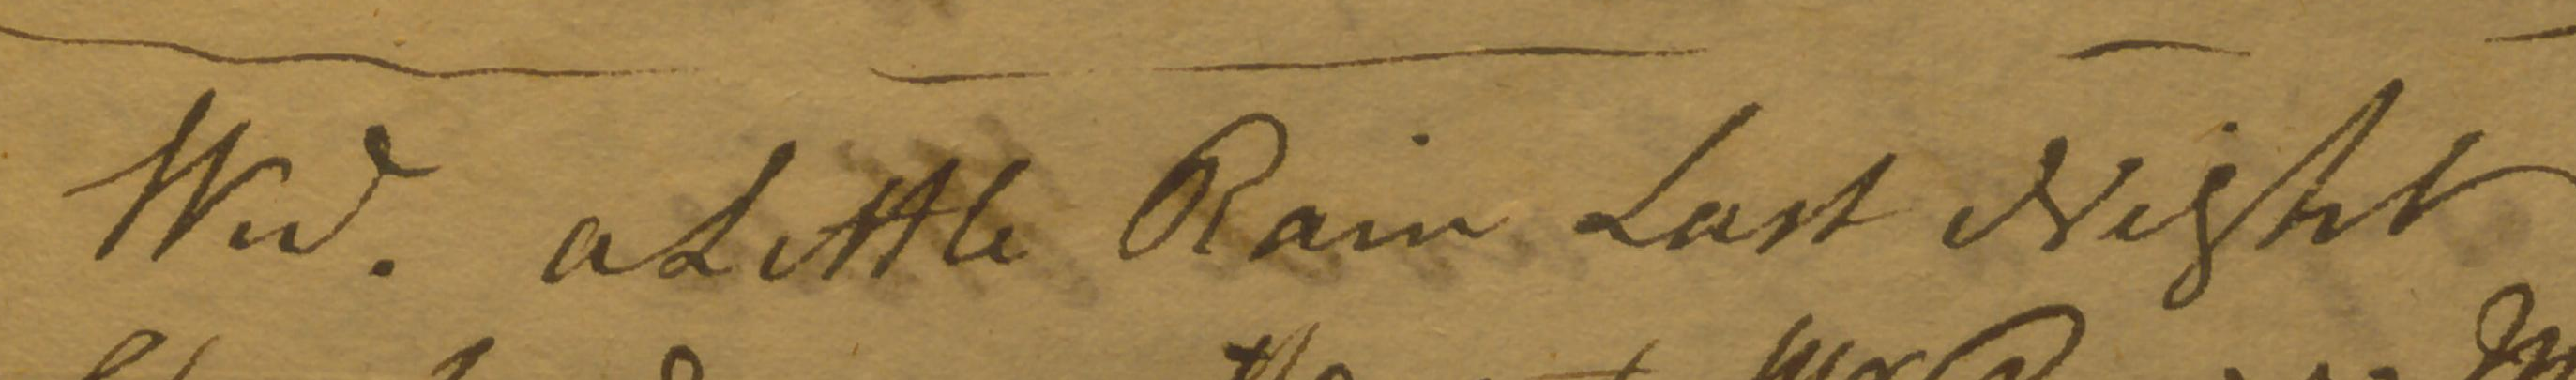Wed, a Little Rain Last Night
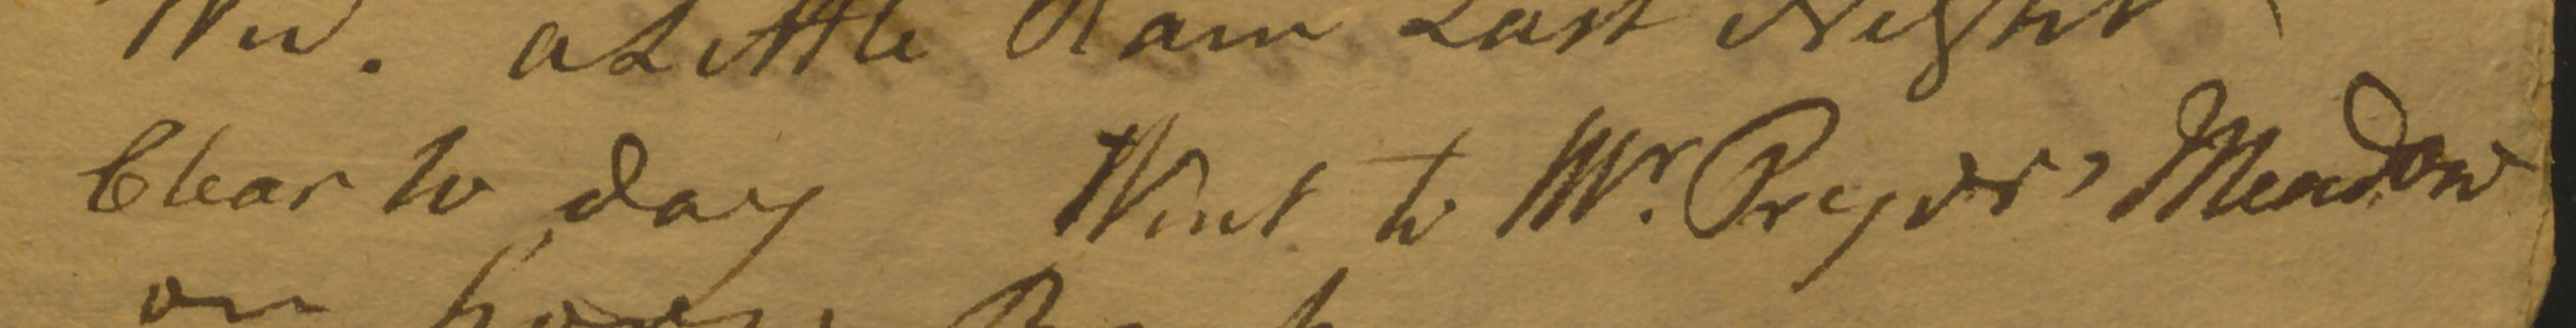Clear to day Went to M^r. Pryors Meadow
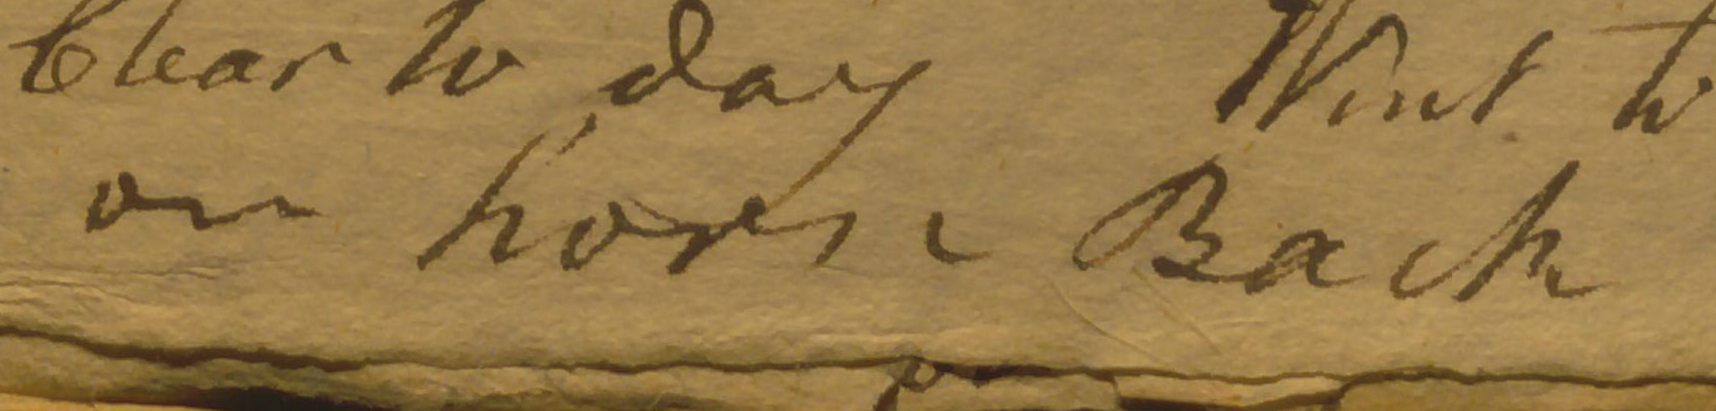on horse Back
